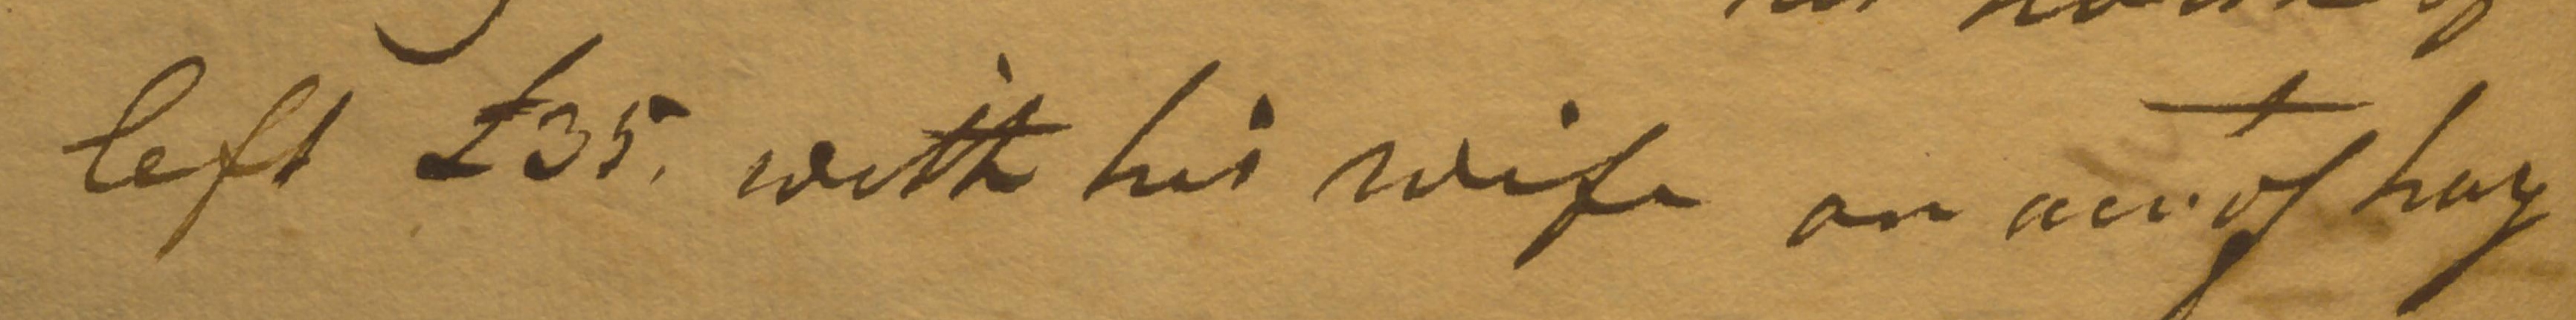left £35. with his wife an acc^t of hay
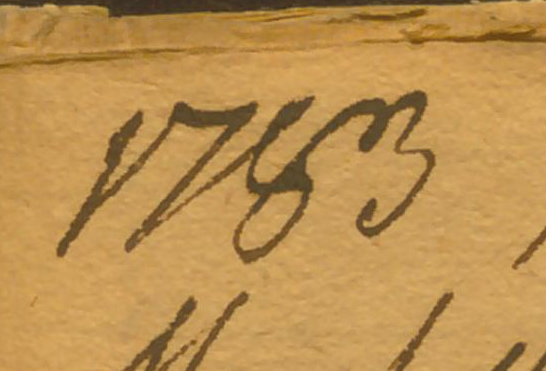1783
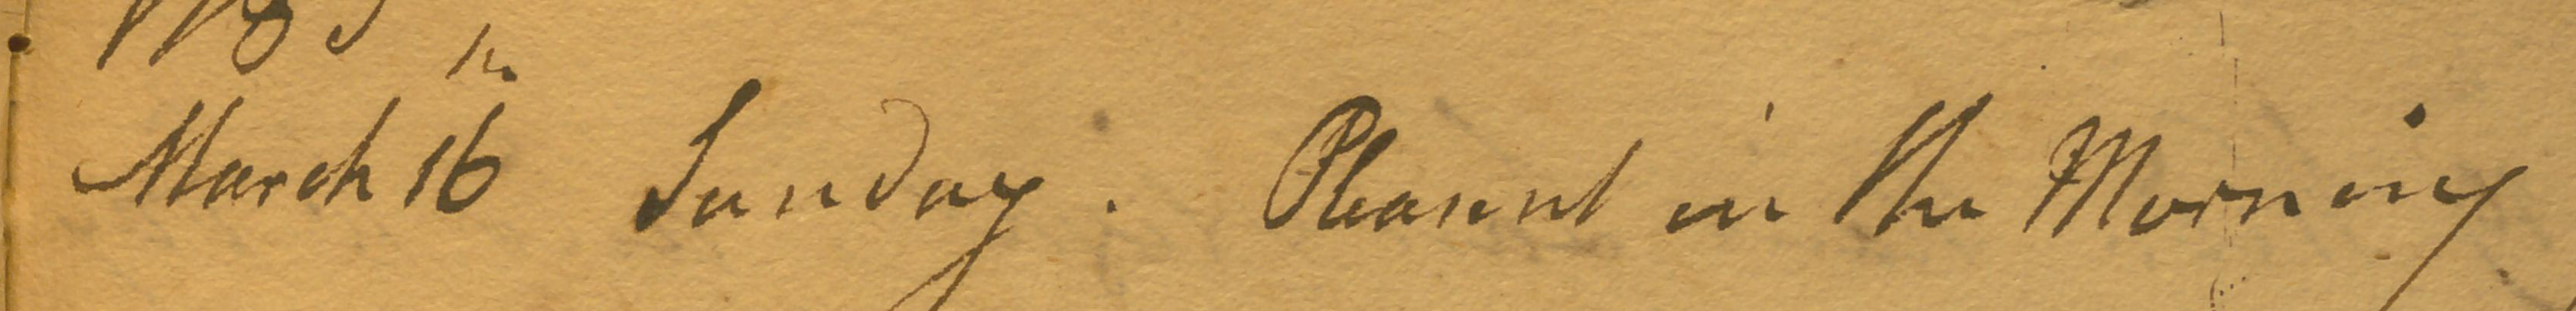March 16h Sunday. Pleasent in the Morning
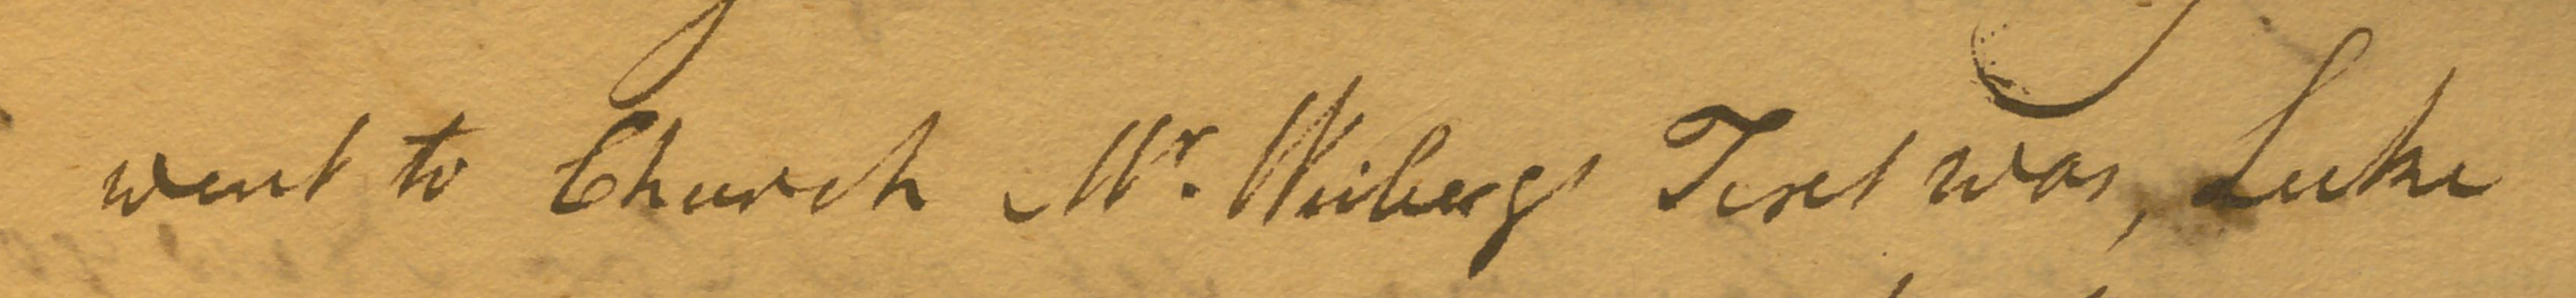went to Church M^r. Weibergs Text was, Luke
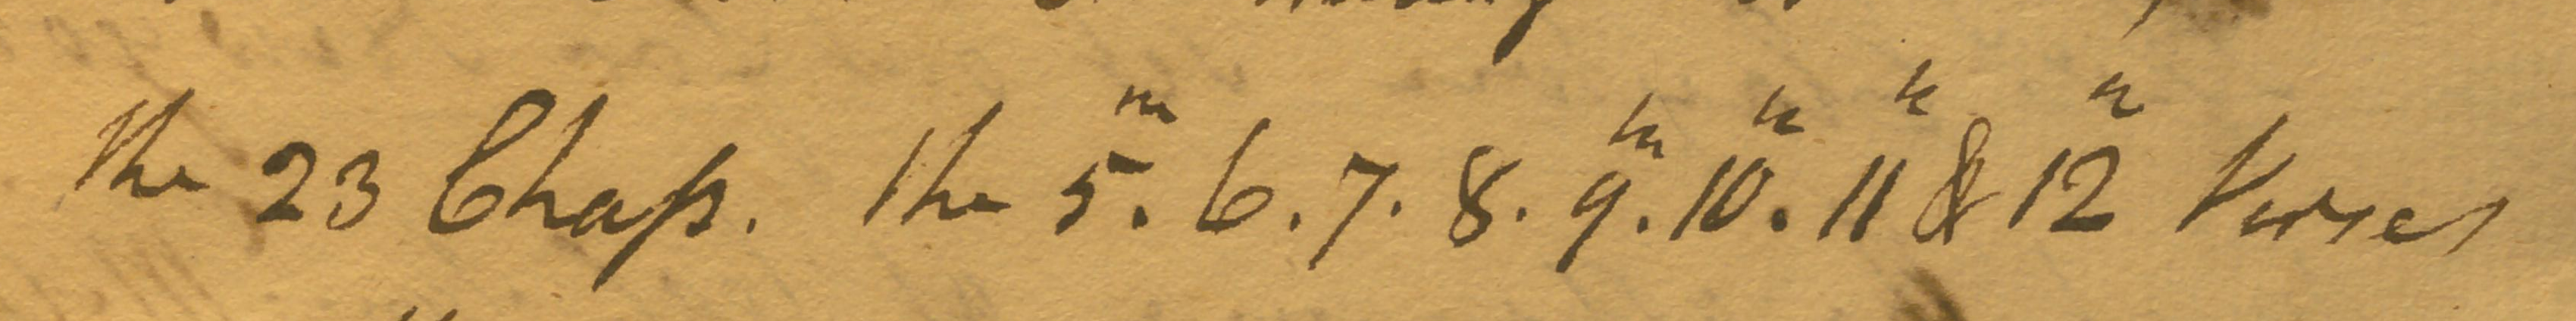the 23 Chap. the 5^th. 6.7. 8. 9^th. 10^th. 11^th & 12^th Verses
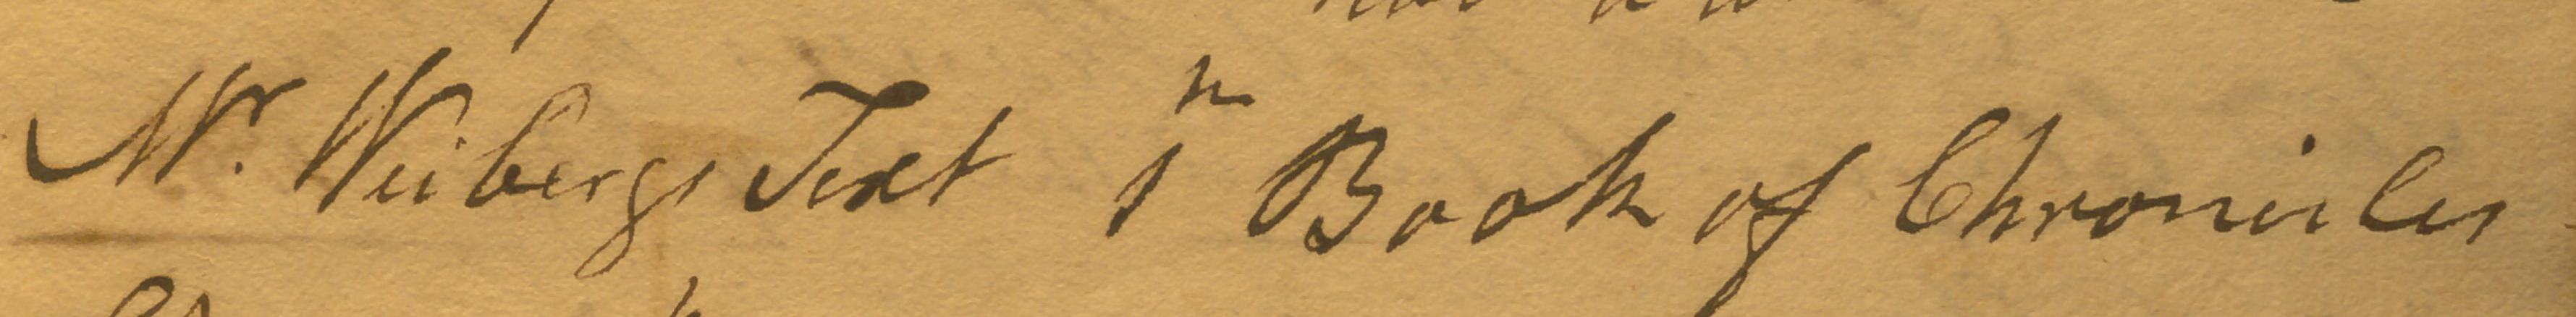M^r Weibergs Text 1^th Book of Chronicles
